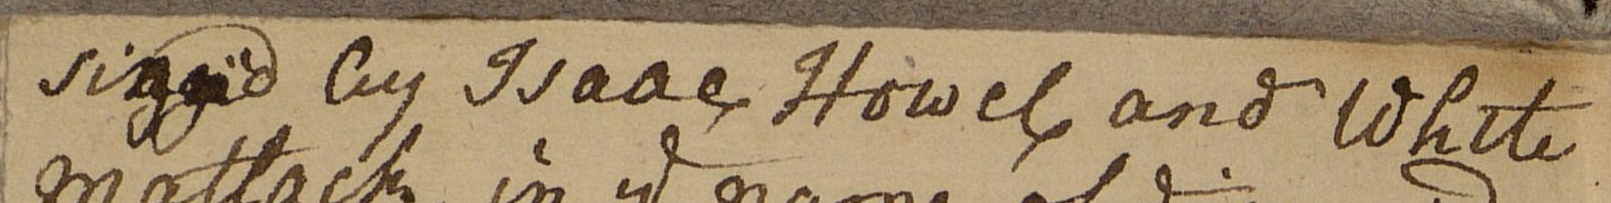sign'd by Isaac Howel and
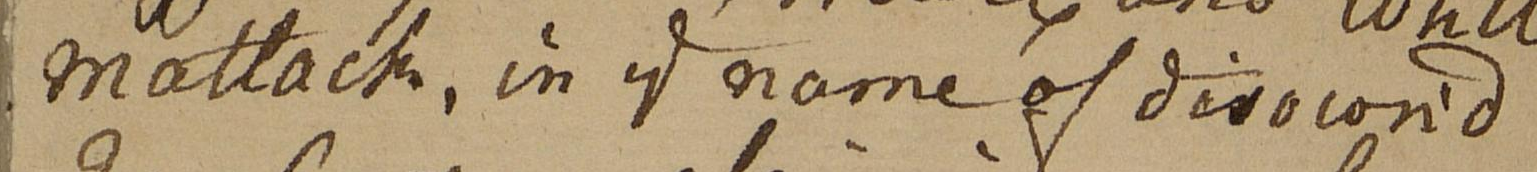Matlack, in y^e name of disown'd
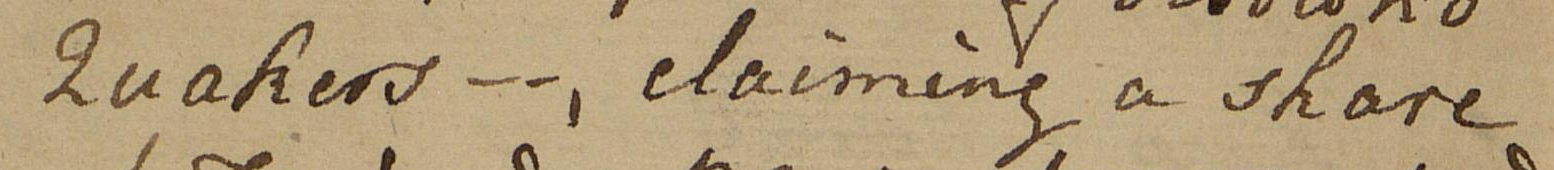Quakers--, claiming a share
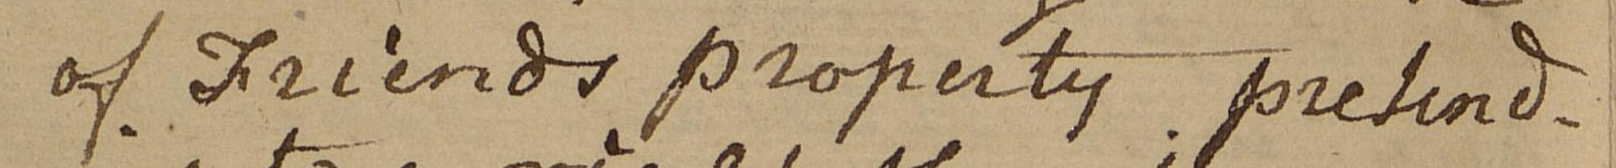of Friends property, pretend-
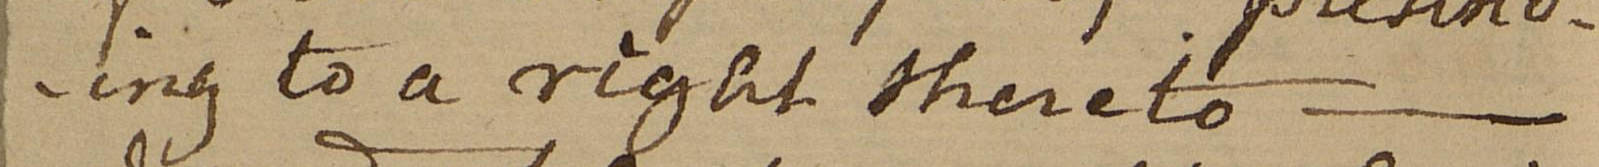-ing to a right thereto-
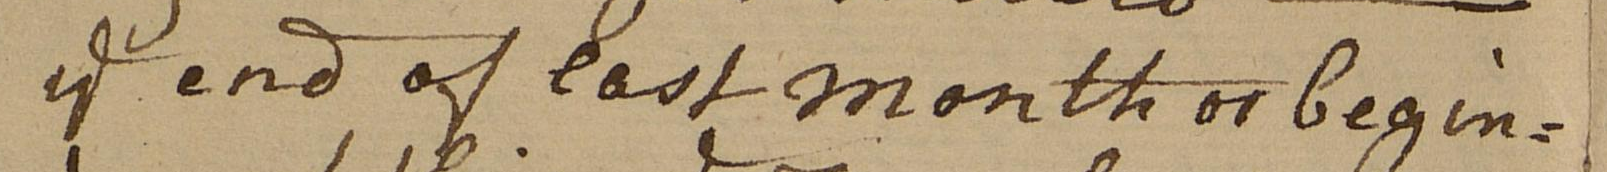y^e end of last month or begin-
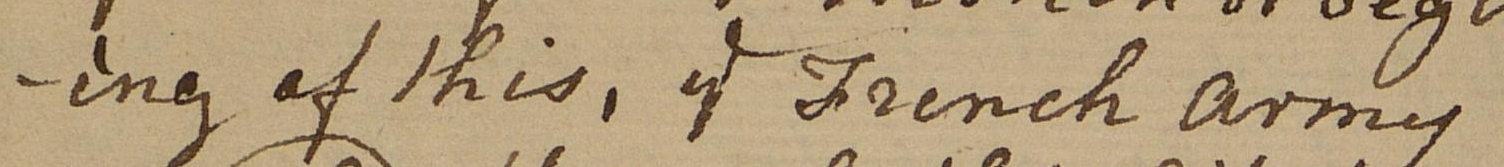-ing of this, y^e French army
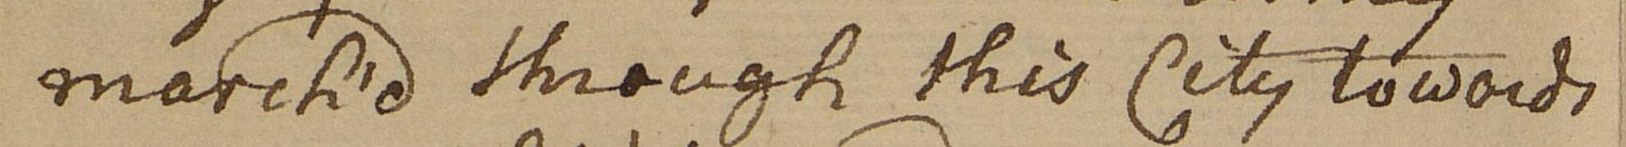march'd through this City towards
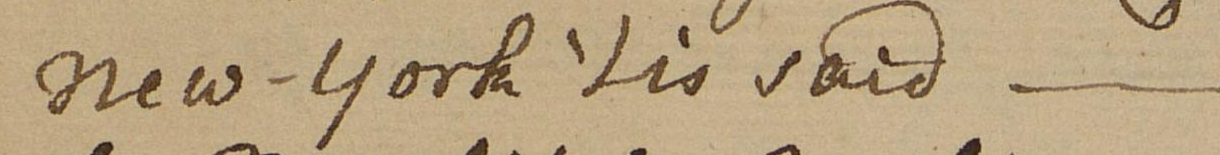New-York 'tis said-
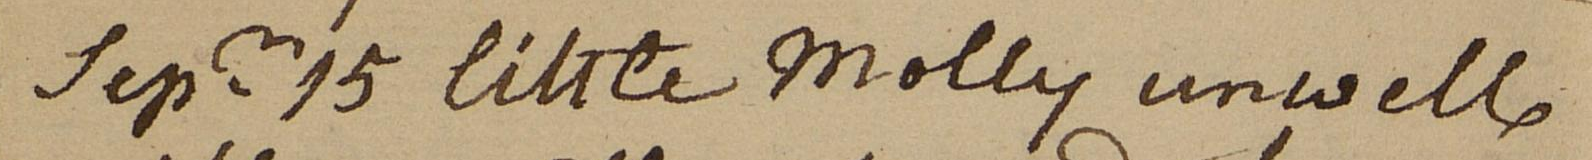Sep^r. 15 little Molly unwell
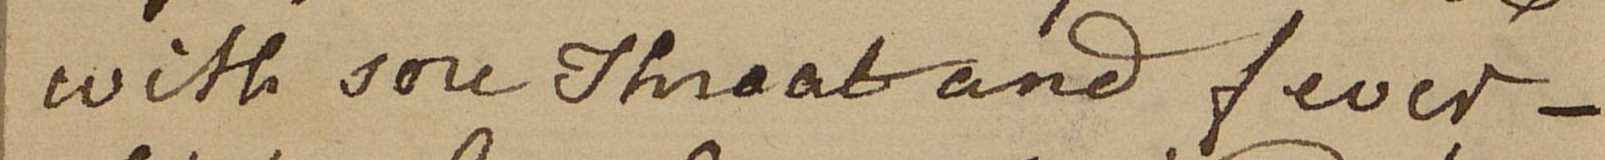with sore Throat and fever-
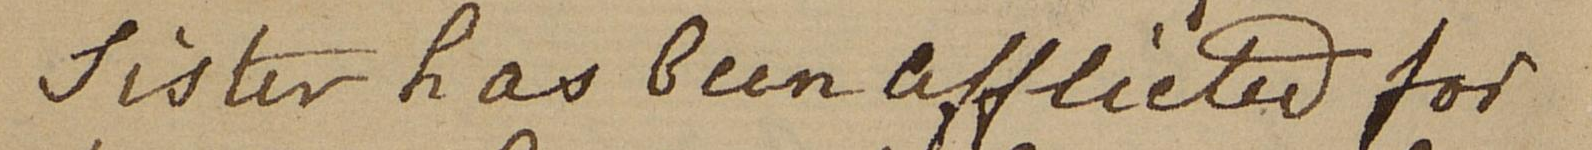Sister has been afflicted for
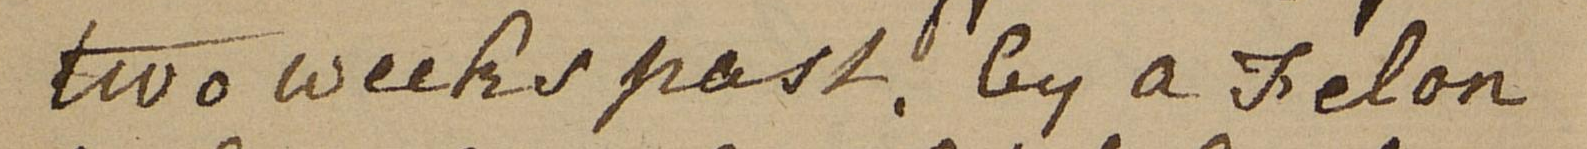two weeks past. by a Felon
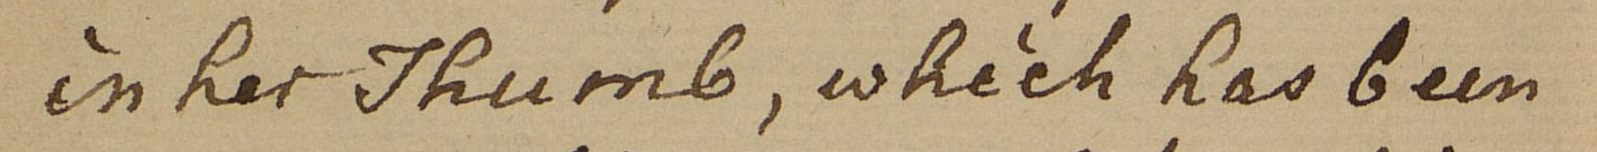in her Thumb, which has been
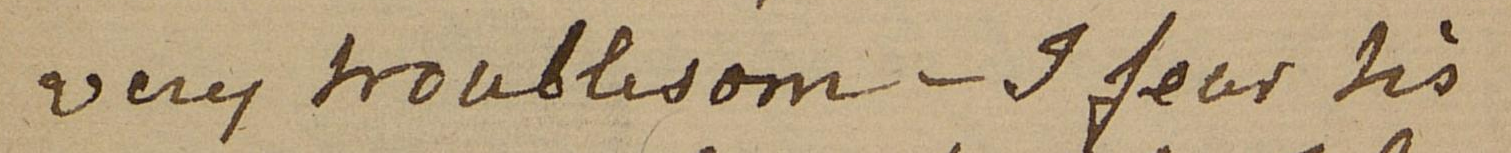very troublesom- I fear tis
